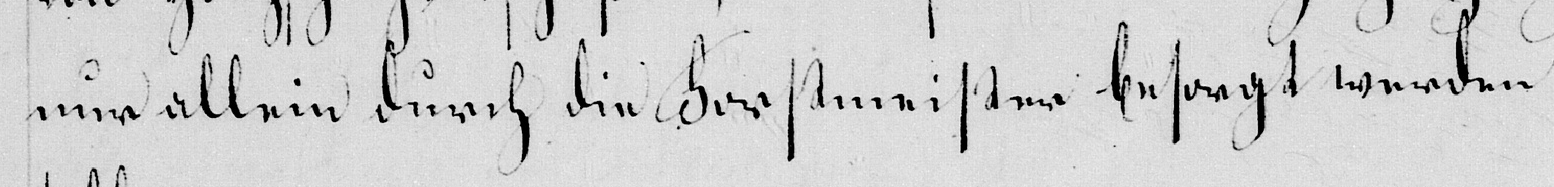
nur allein durch die Forstmeister besorgt werden
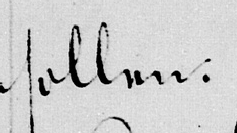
sollen.
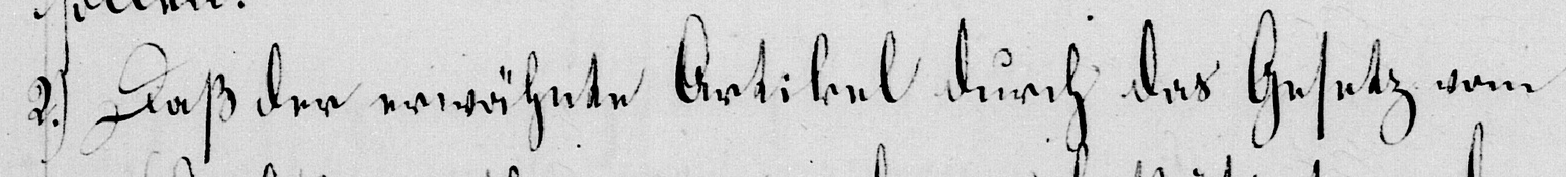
2.) Daß der erwähnte Artikel durch das Gesetz vom
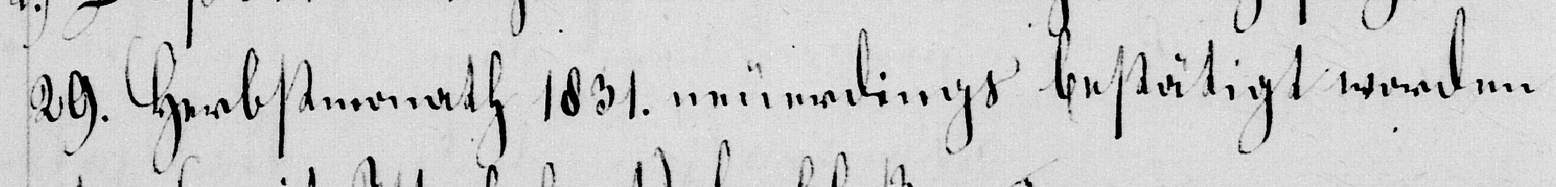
29. Herbstmonath 1831. neuerdings bestätigt worden
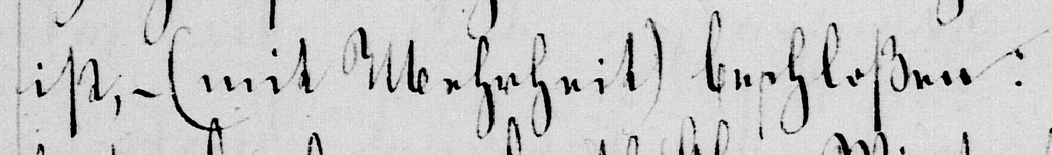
ist, – (mit Mehrheit) beschloßen:
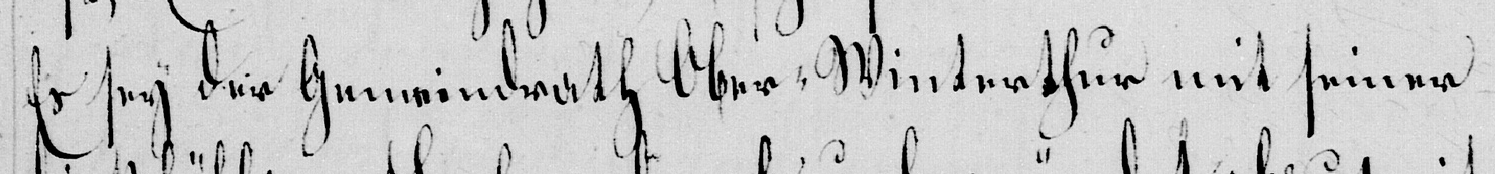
Es sey der Gemeindrath Ober-Winterthur mit seiner
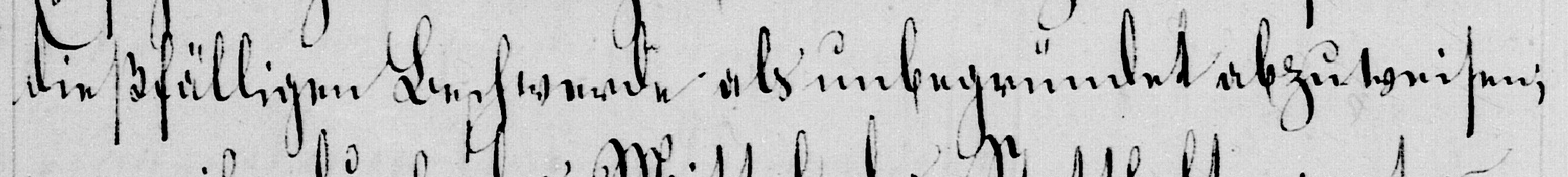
dießfälligen Beschwerde als unbegründet abzuweisen;
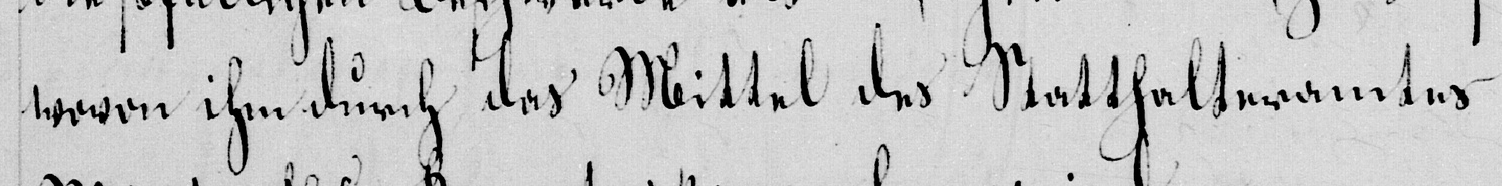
wovon ihm durch das Mittel des Statthalteramtes
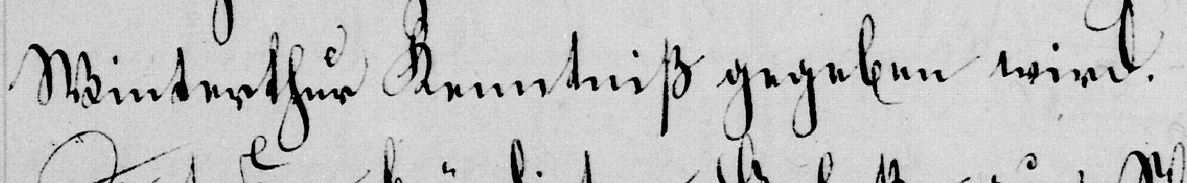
Winterthur Kenntniß gegeben wird.
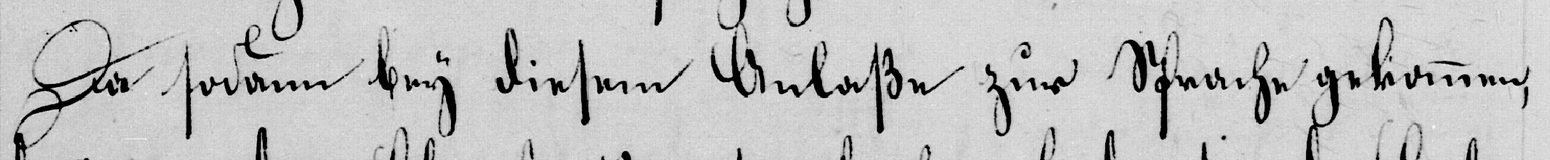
Da sodann bey diesem Anlaße zur Sprache gekommen,
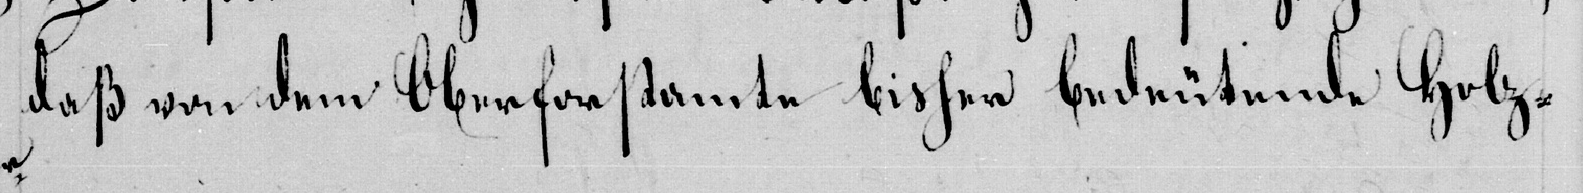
daß von dem Oberforstamte bisher bedeutende Holz-
